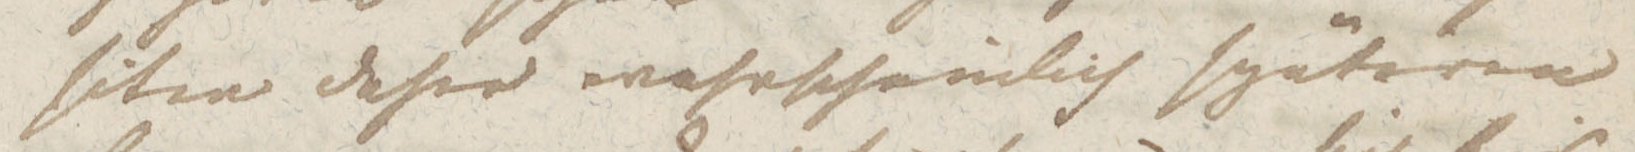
siten daher wahrscheinlich späteren
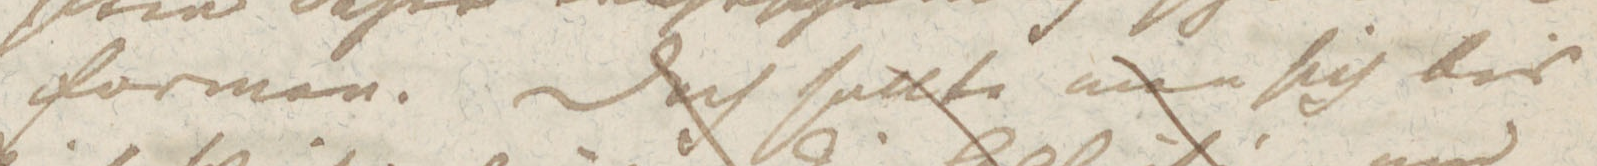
Formen. Doch sollte man sich bis
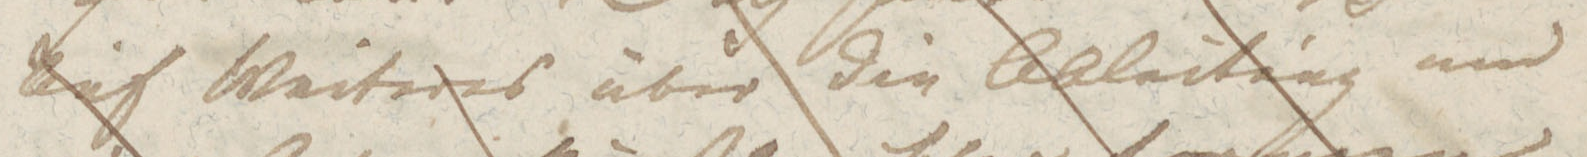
auf Weiteres über die Ableitung und
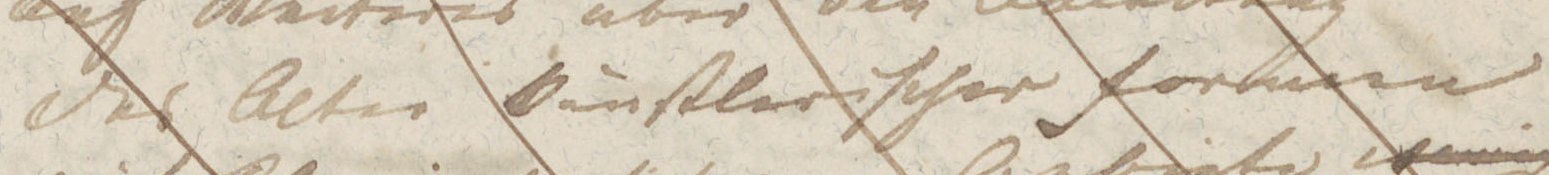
das Alter künstlerischer Formen
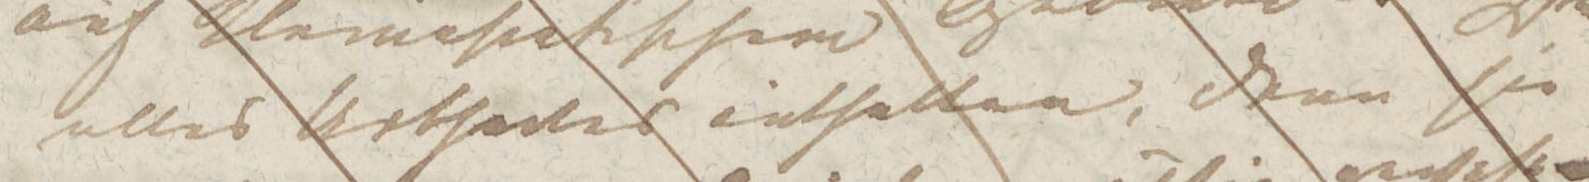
alles Urtheiles enthalten, denn sie
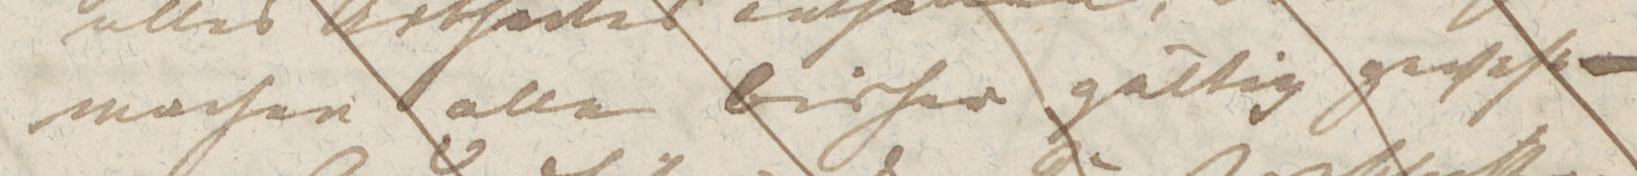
machen alle bisher gültig gewese-
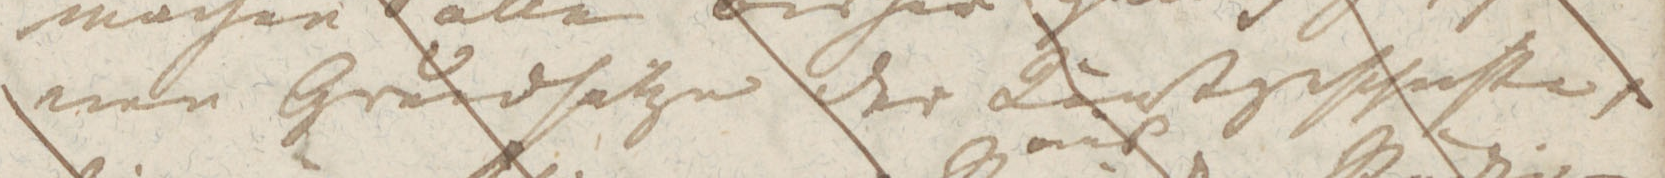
nen Grundsätze der Kunstgeschichte,
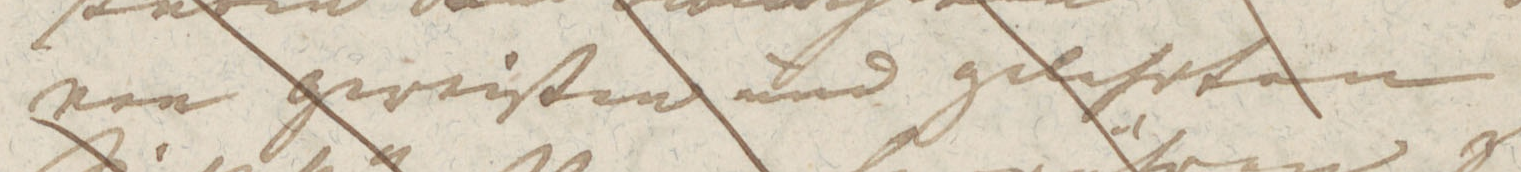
von gereisten und gelehrten
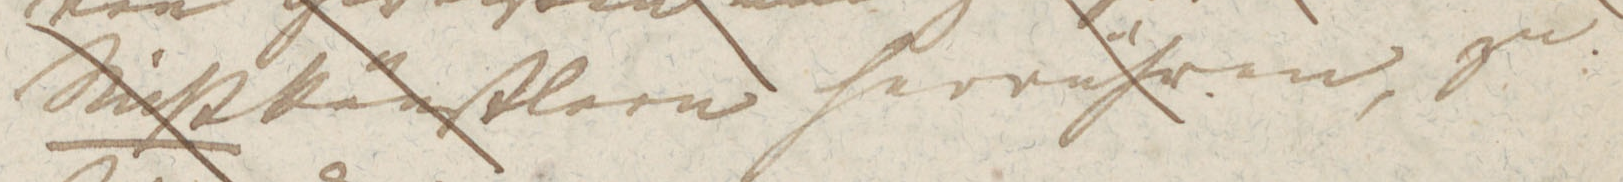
Nichtkünstlern herrühren, zu
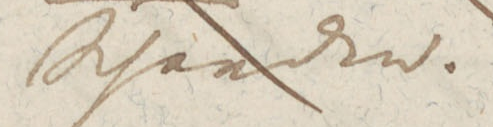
Schanden.
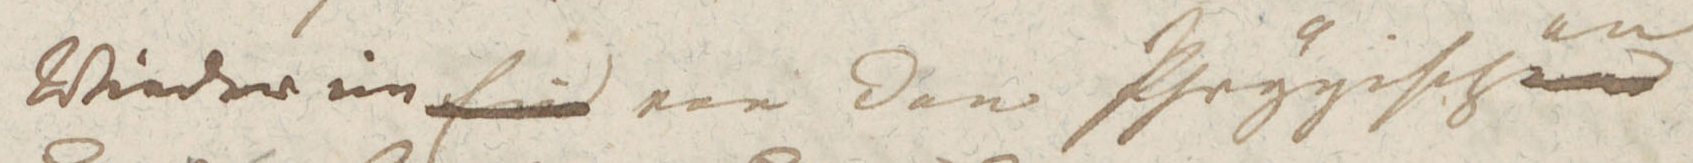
Wieder in Ein von den Phrygischenen
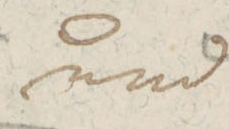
% und
